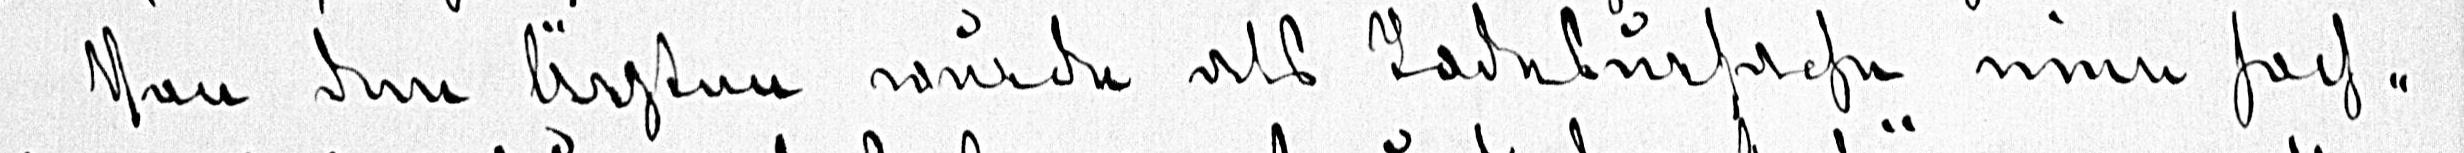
Von den Ärzten wurde als todesursache eine hoch¬
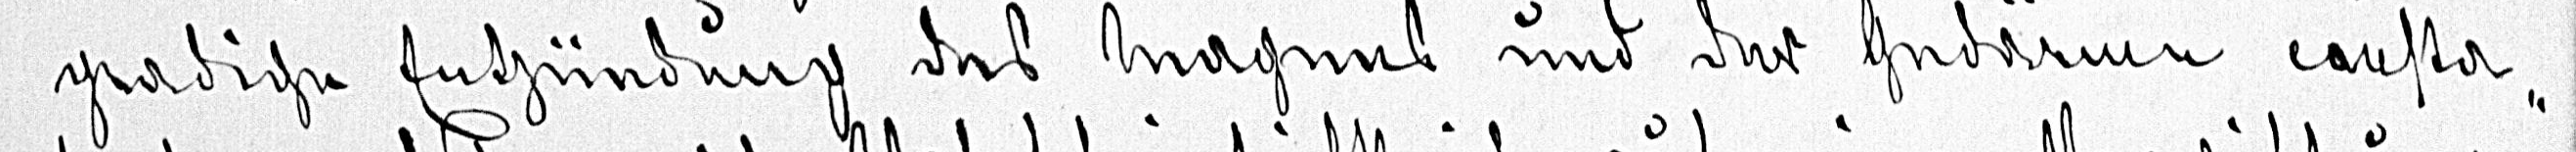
gradige Entzündung des Magnes undd er Gedärme consta¬
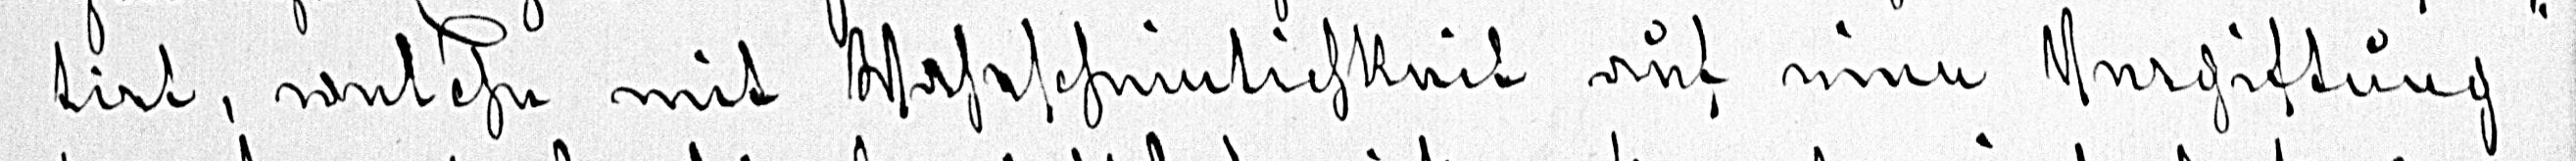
tirt, welche mit Wahrscheinlichkeit auf eine Vergiftung
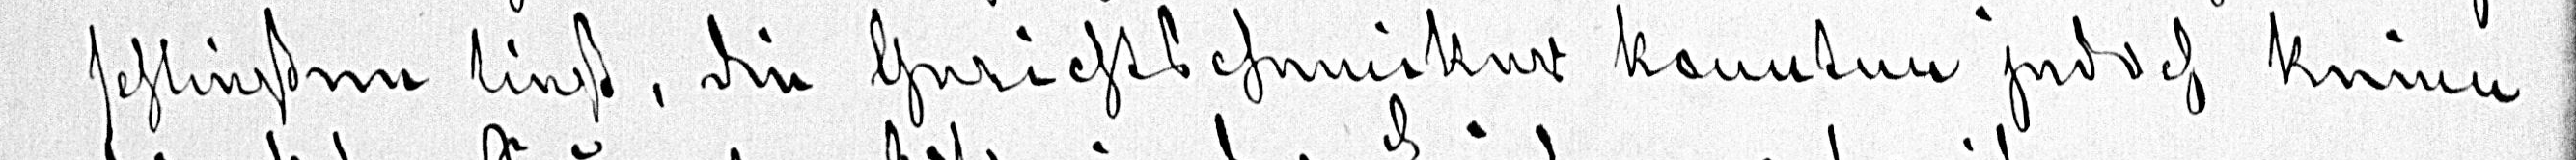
schließen ließ, die Gerichtschxxker konnten jedoch keine
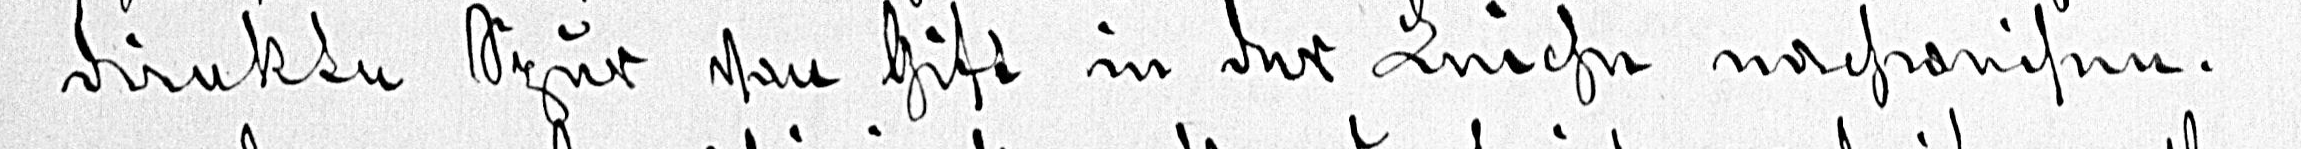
direkte Spur von Gift in der Leiche nachweisen.
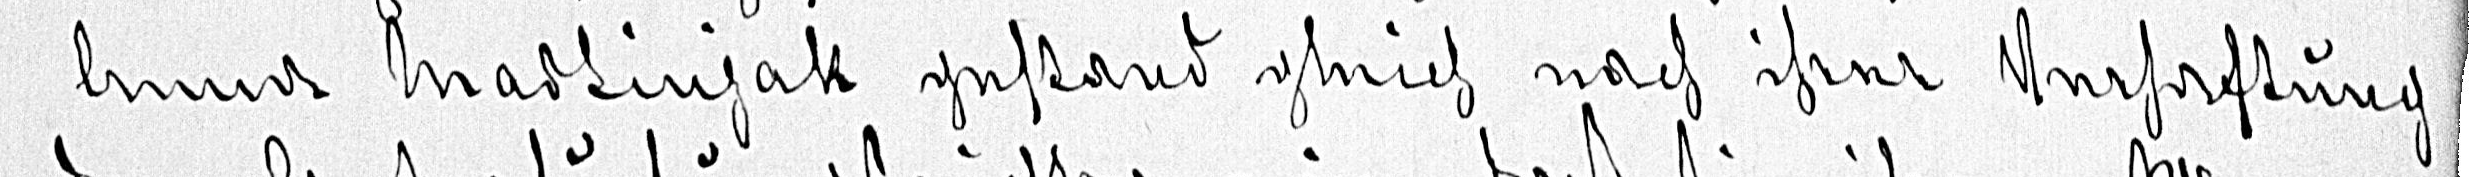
Anna Martinjak gestand gleich nach ihrer Verhaftung
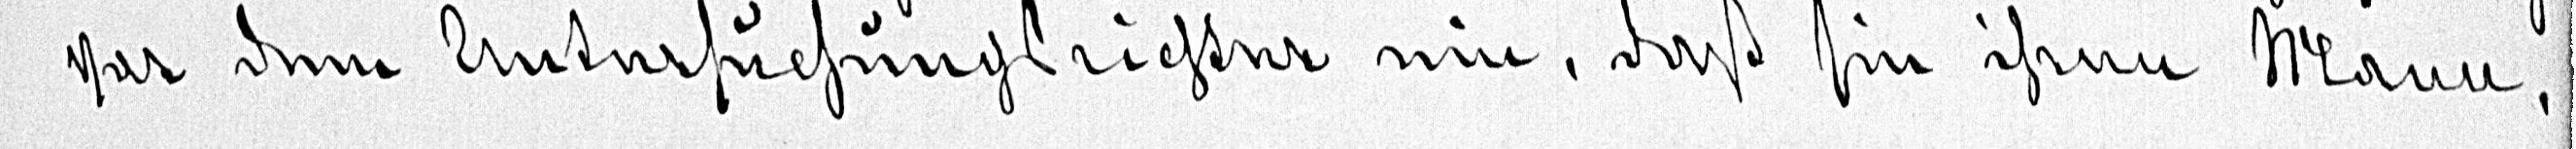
vor dem Untersuchungsrichter ein, daß sie ihren Mann,
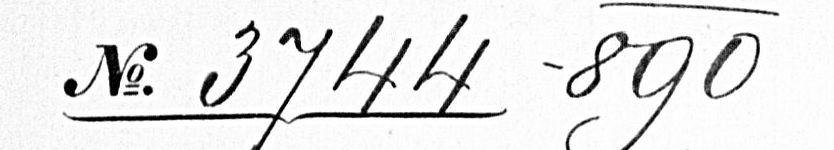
N° 3744-890
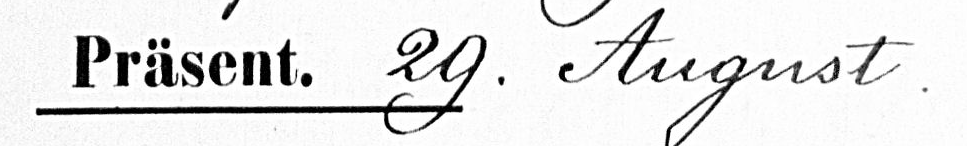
Präsent. 29. August.
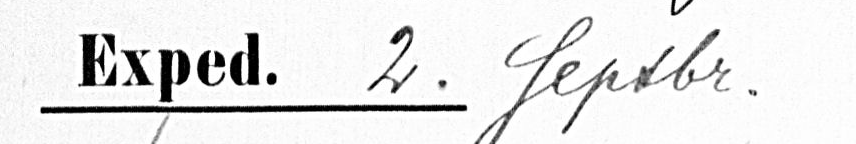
Exped. 2. Septbr.
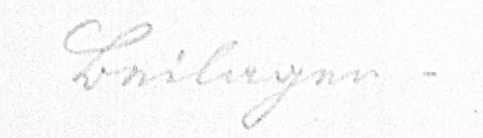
Beilagen.
